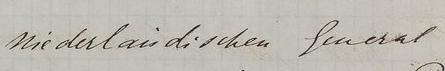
niederländischenGeneral-
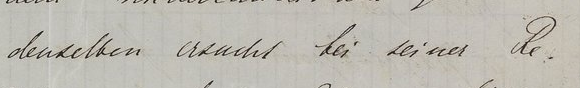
denselben ersucht bei seiner Re-
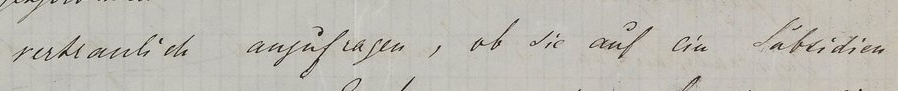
vertraulich anzufragen, ob sie auf ein Subsidien-
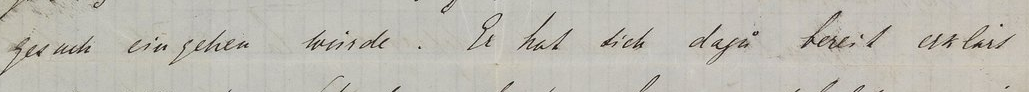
gesuch eingehen würde. Er hat sich dazu bereit erklärt
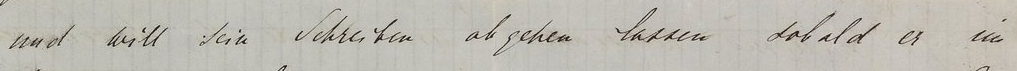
und will sein Schreiben abgehen lassen sobald er im
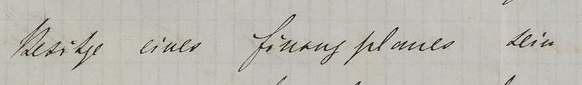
Besitze eines Finanzplanes sein
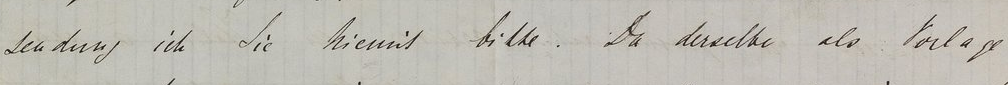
sendung ich Sie hiemit bitte. Da derselbe als Vorlage
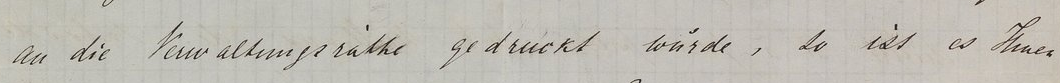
an die Verwaltungsräthe gedruckt wurde, so ist es Ihnen
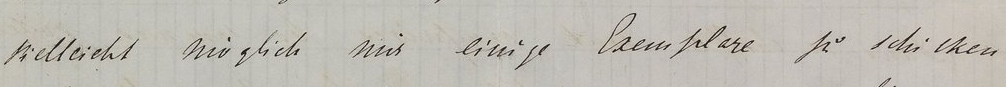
vielleicht möglich mir einige Exemplare zu schicken.
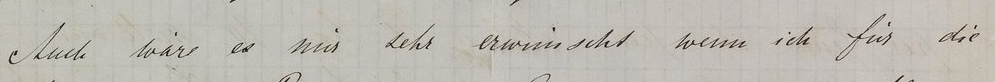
Auch wäre es mir sehr erwünscht wenn ich für die
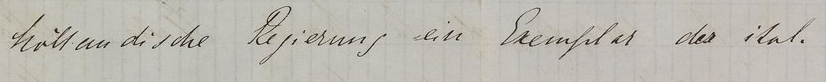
holländische Regierung ein Exemplar des ital.
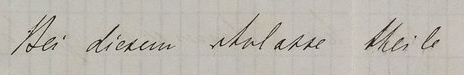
Bei diesem Anlasse theile
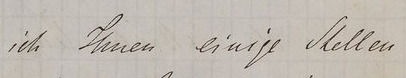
ich Ihnen einige Stellen
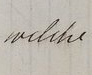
aus einer
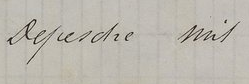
Depesche mit
